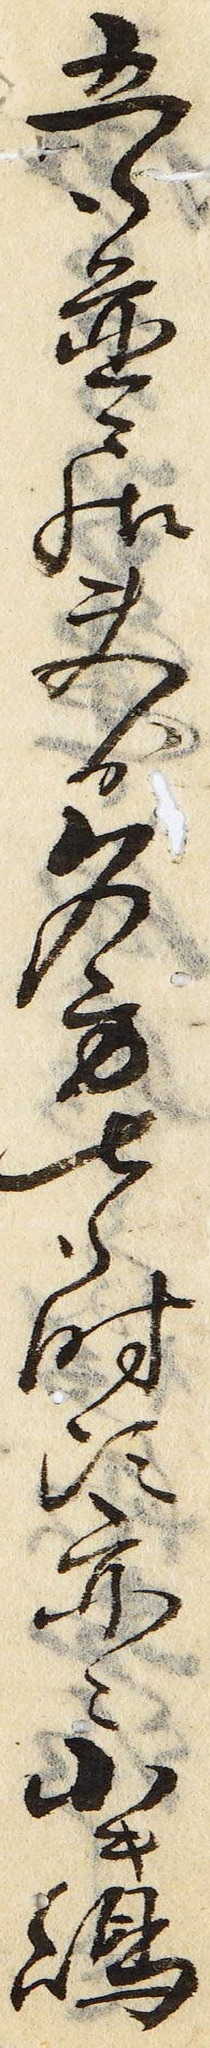五ツ並居夫ゟ夕方七ツ時頃亦々小キ嶋
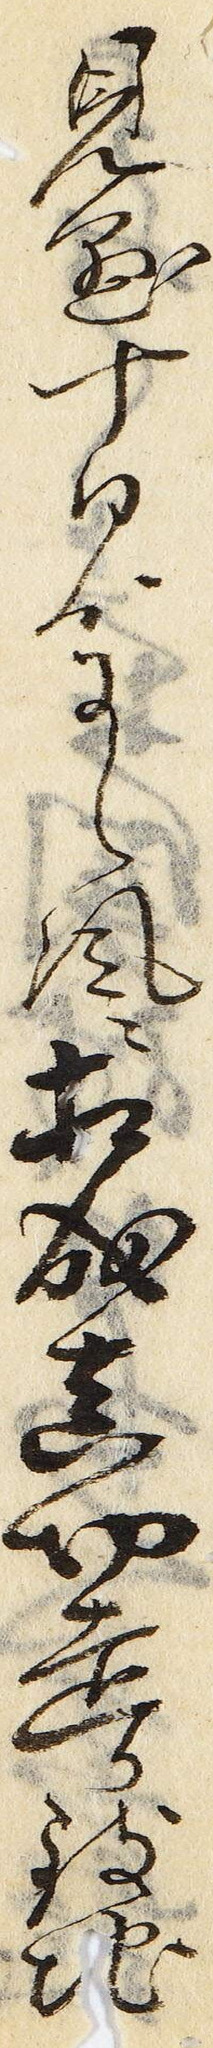見懸十日ゟにし風ニ相成真切走り致地
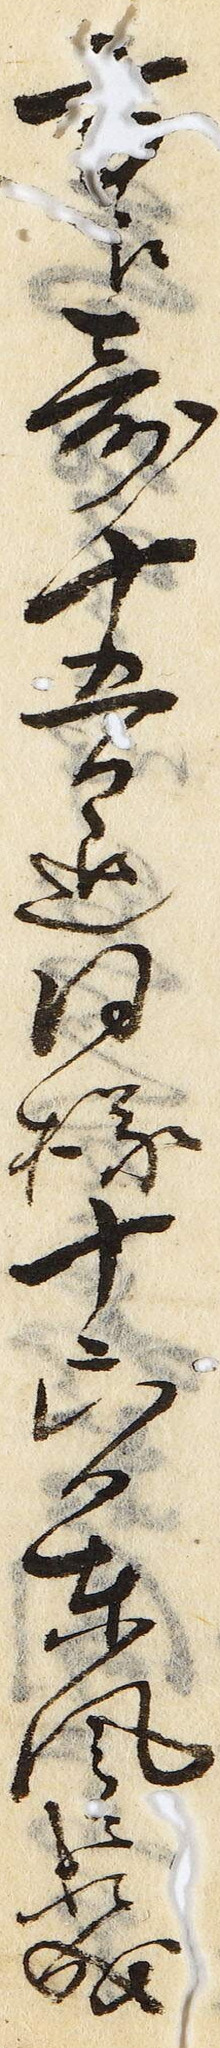方え寄十五日迄同様十六日東風ニ相成
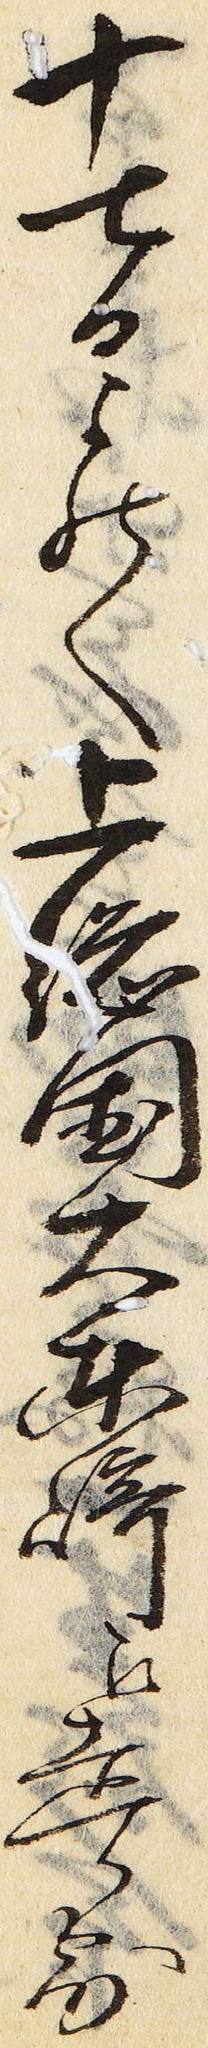十七日よの〳〵？上総国大東崎え走り寄
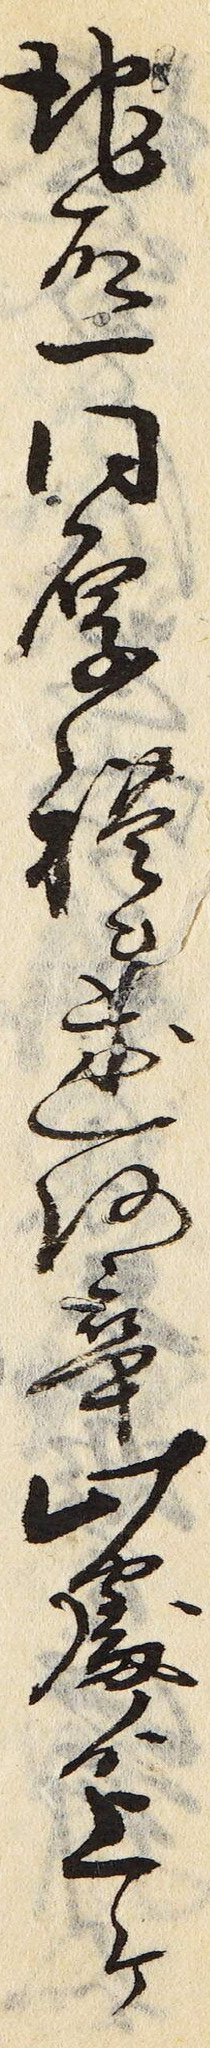地故一同厚礼ヲ述何卒此処ゟ上ケ
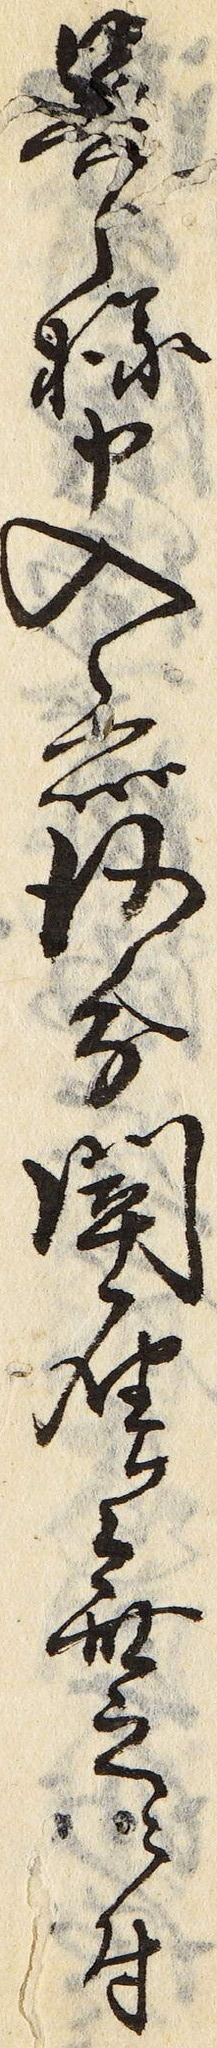呉候様申入候所何分聞届ケ無之ニ付
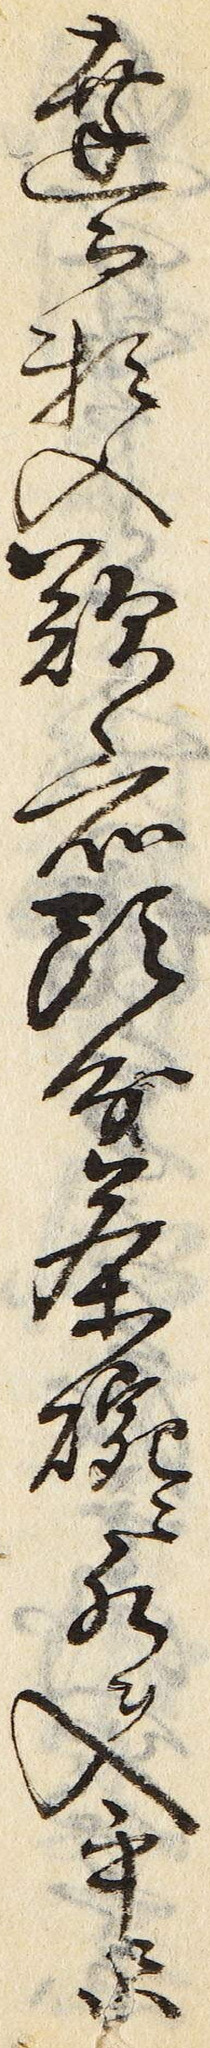達而頼入歎候所頭分茶碗ニ水ヲ入手ニハ
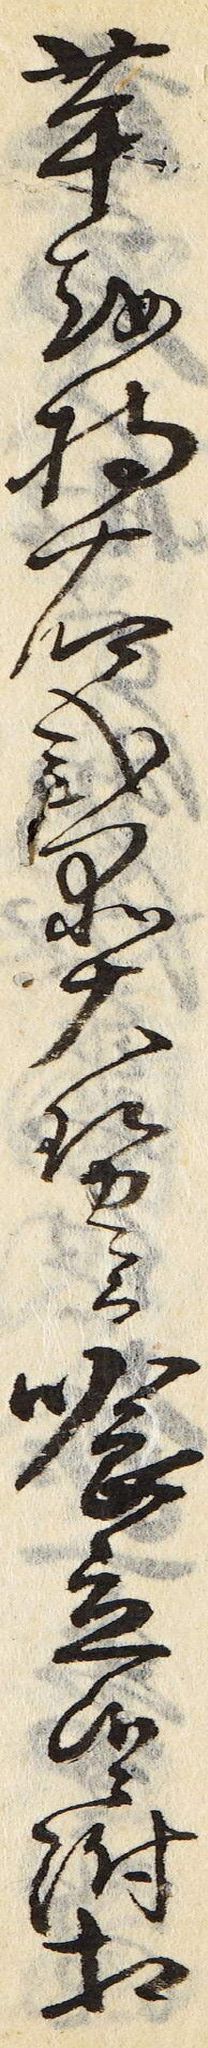芋を持右弐品大勢ニ而喰立候ニ付相
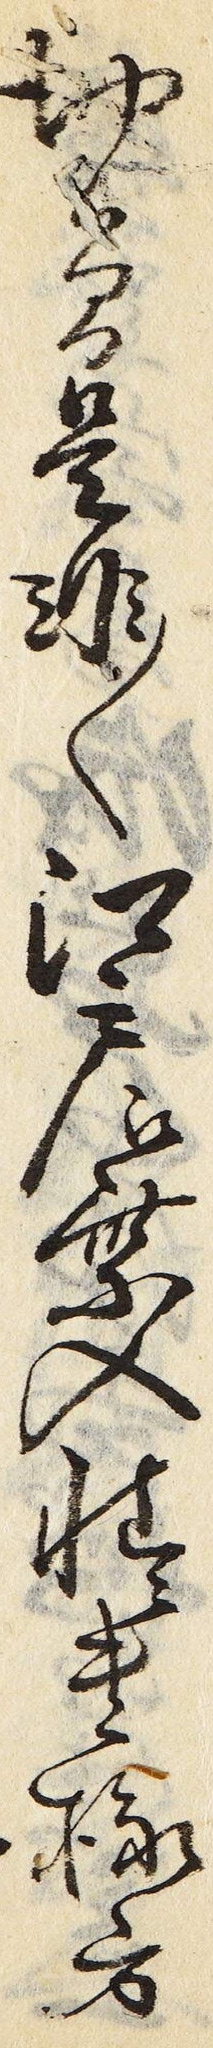切候間是非〳〵江戸え乗入慥ニ貴様方
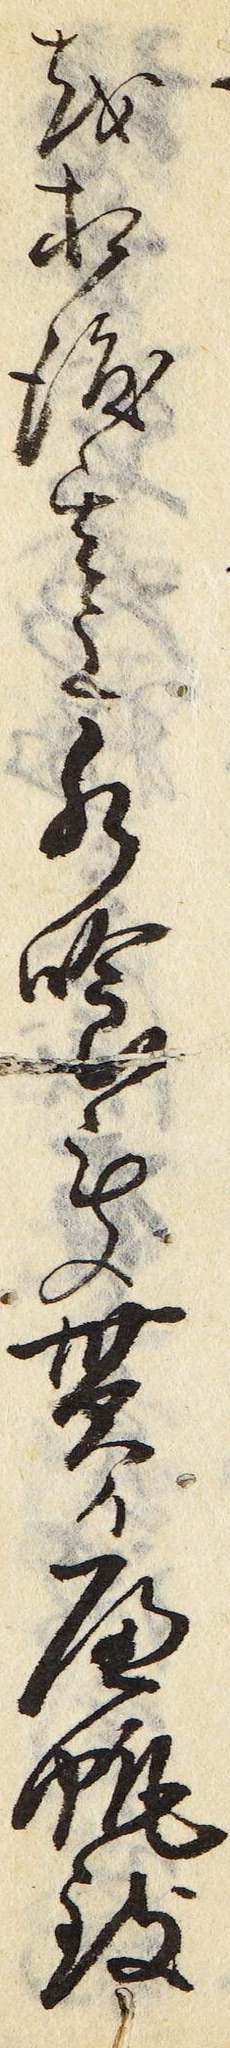を相渡其上水食もの貰イ帆致
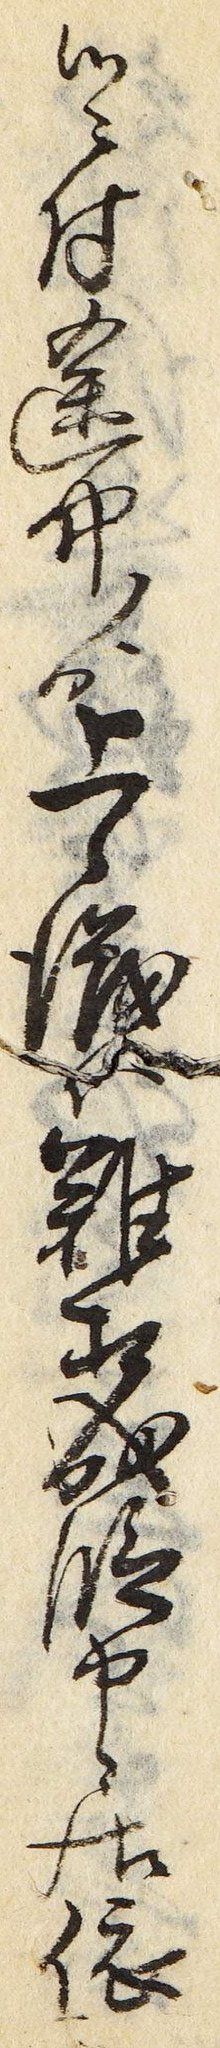候ニ付途中ゟ上候儀ハ難相成段申居依
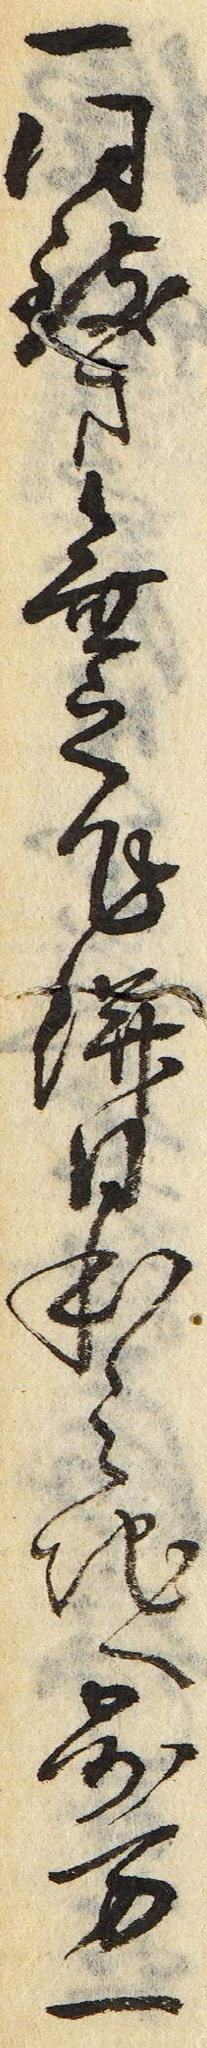一同致方無之乍併日本之地へ寄万一

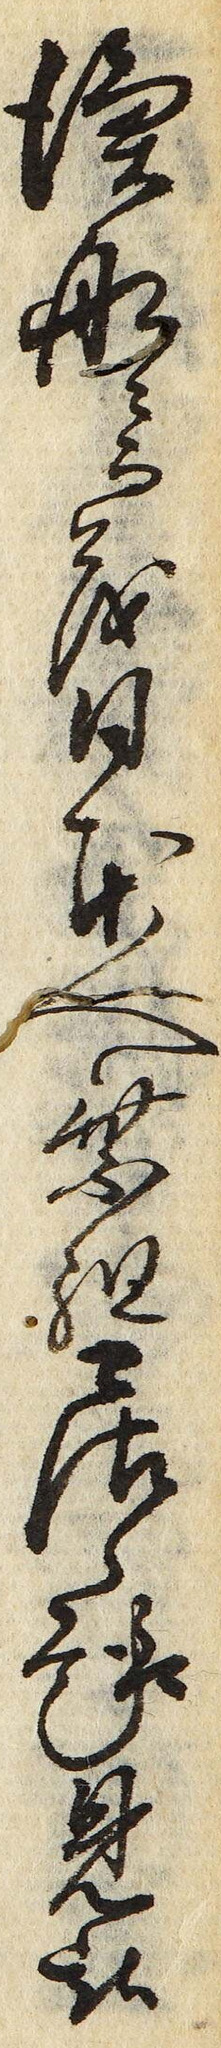漁船ニ而も日本人乗組居候趣見被
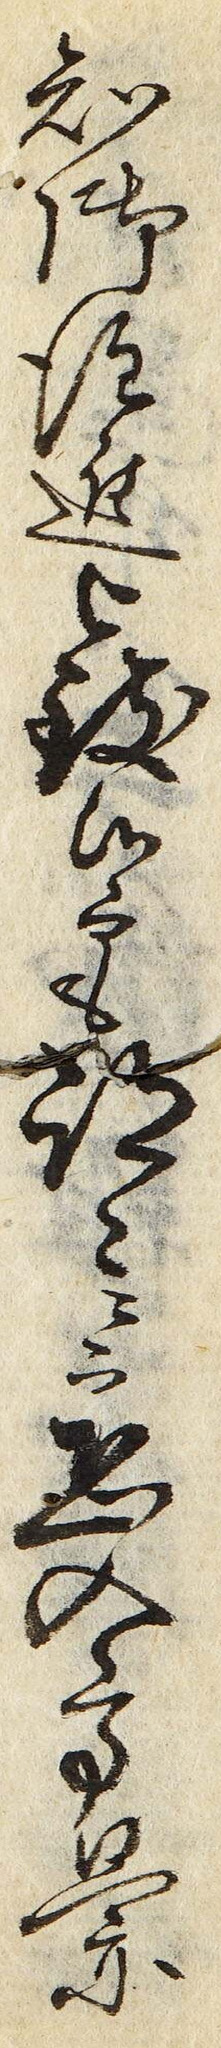知御注進被致候而も跡々ニ而恐入候事且亦
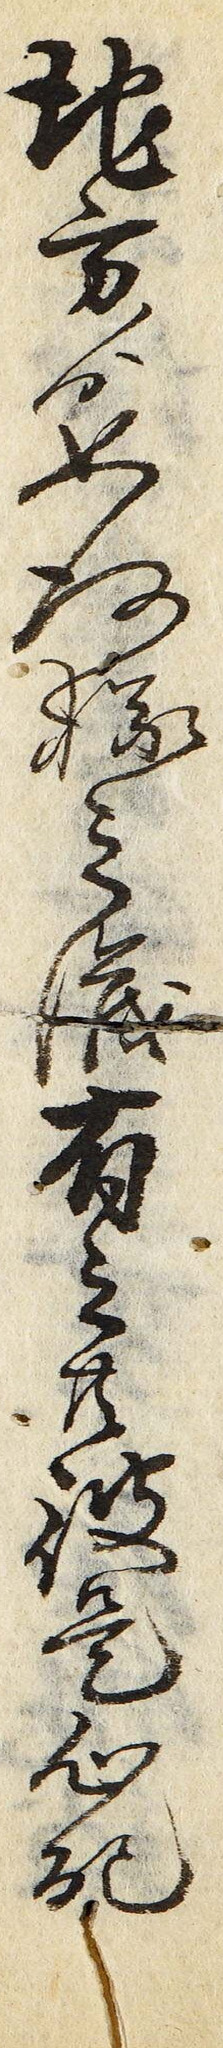地方ゟ如何様之儀有之共彼是心配
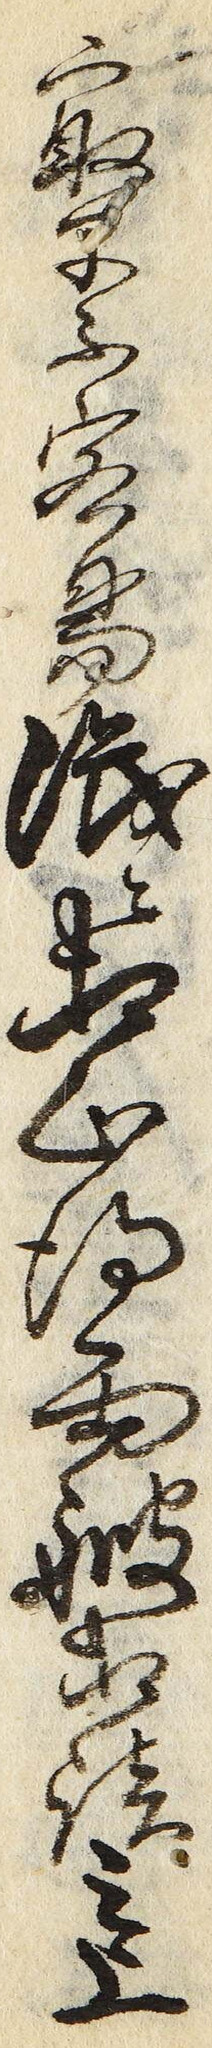最早不容易儀と相心得両艘相談之上
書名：阿波幸宝丸漂流記
